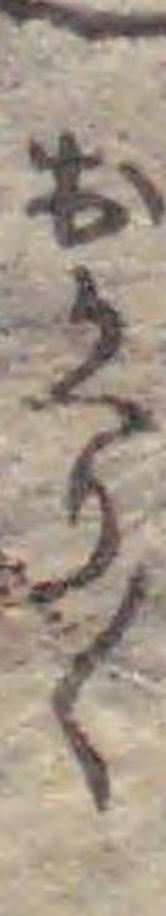おかへり〳〵

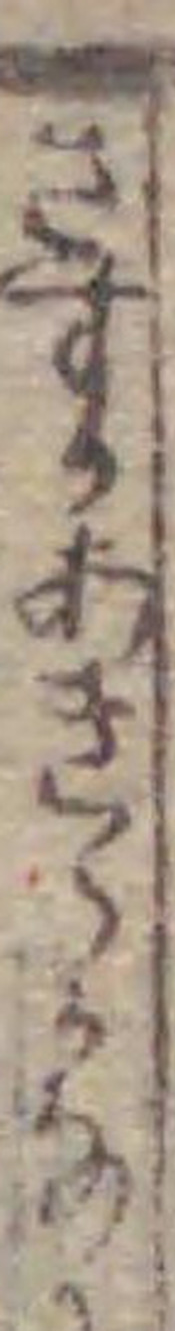さすかあきらかなる
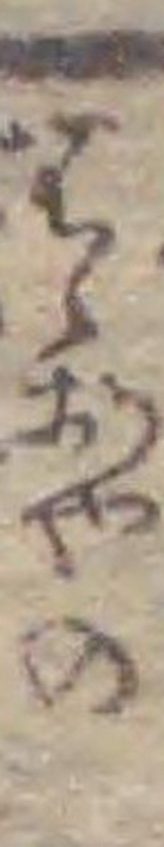はゝおやの
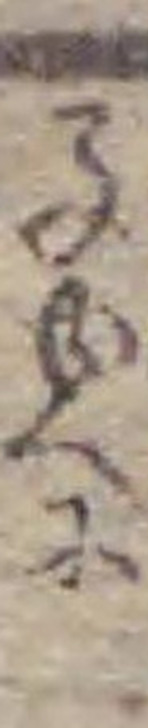子ゆへに
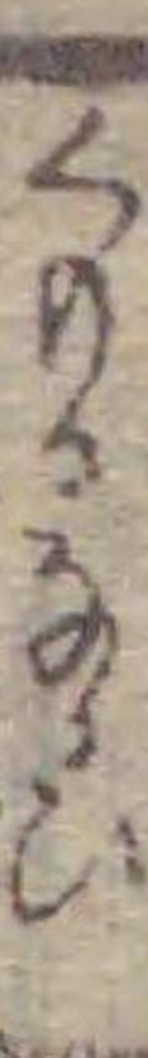くもるならひ
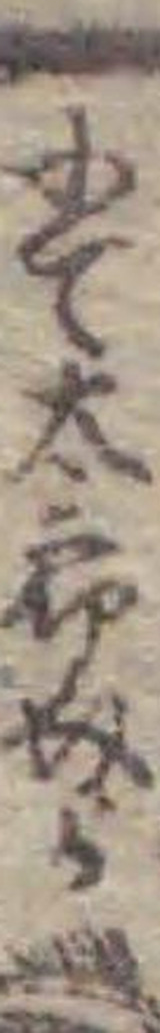にて太郎介か
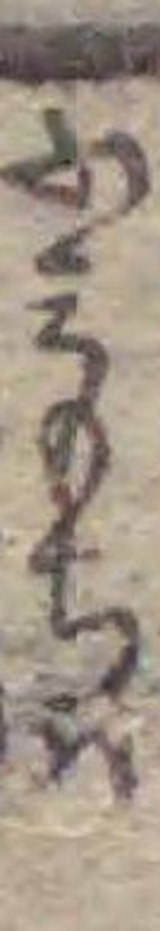ふみもちは
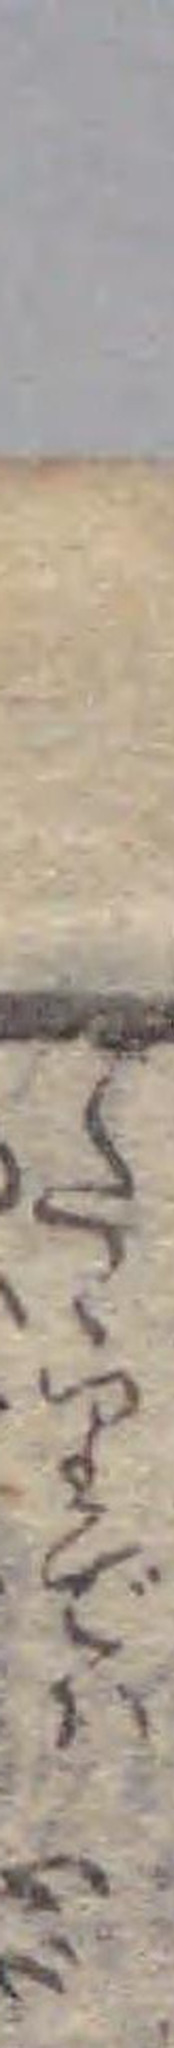たゝりでは
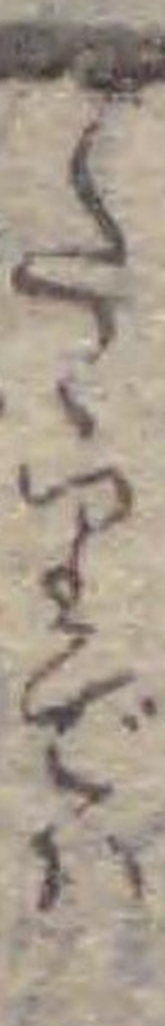たゝりでは
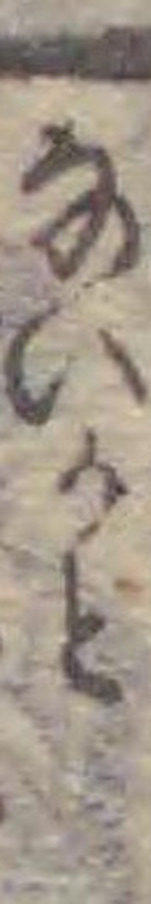ないかと
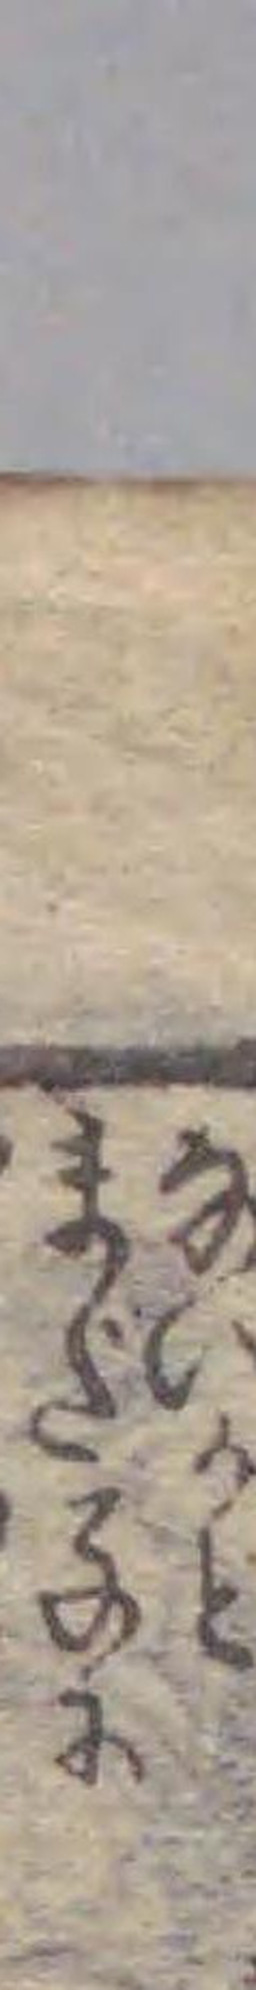まだ子に
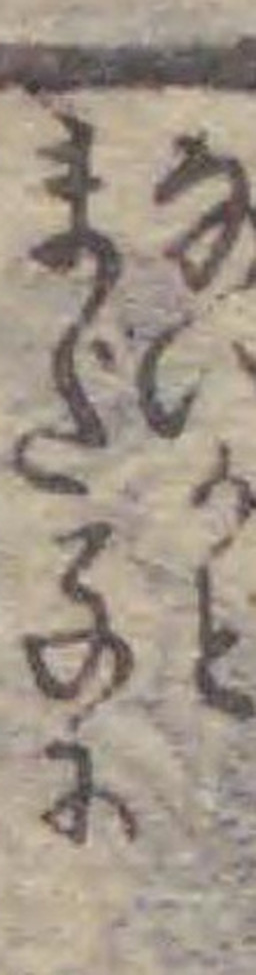まだ子に
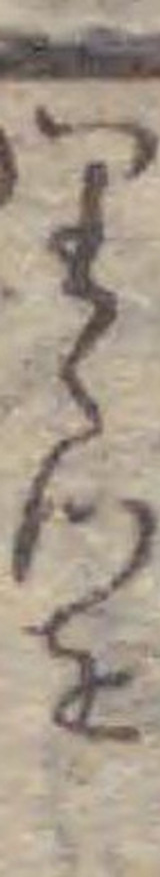りくつを
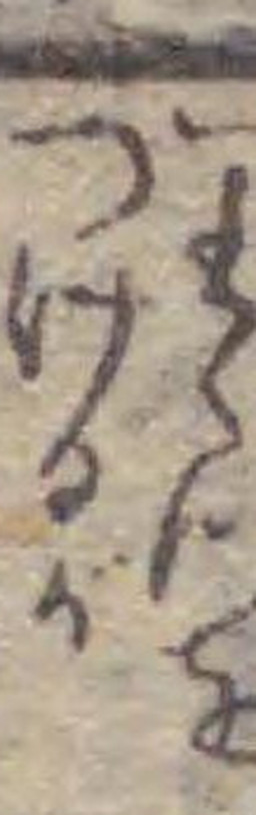つけるが
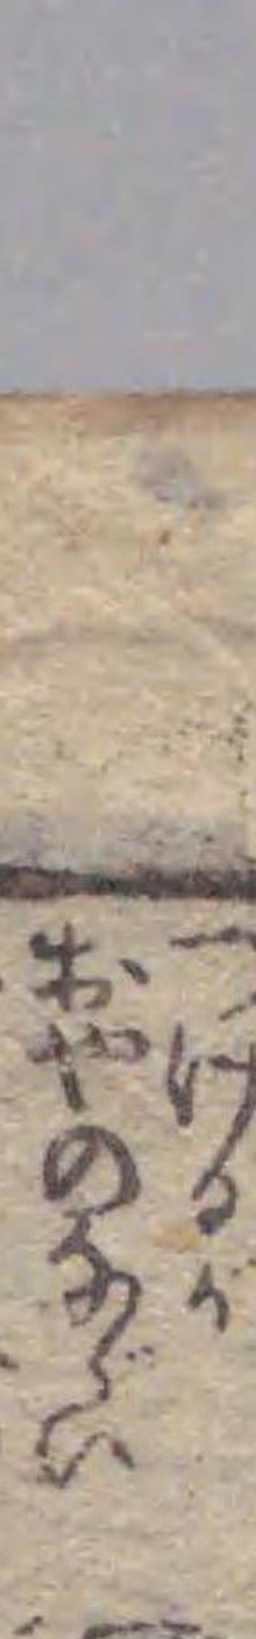おやのならい
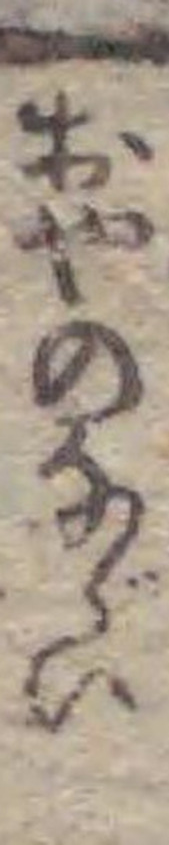おやのならい
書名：四遍搨心学草帋 : 3巻
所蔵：国立国会図書館 National Diet Library, JAPAN
